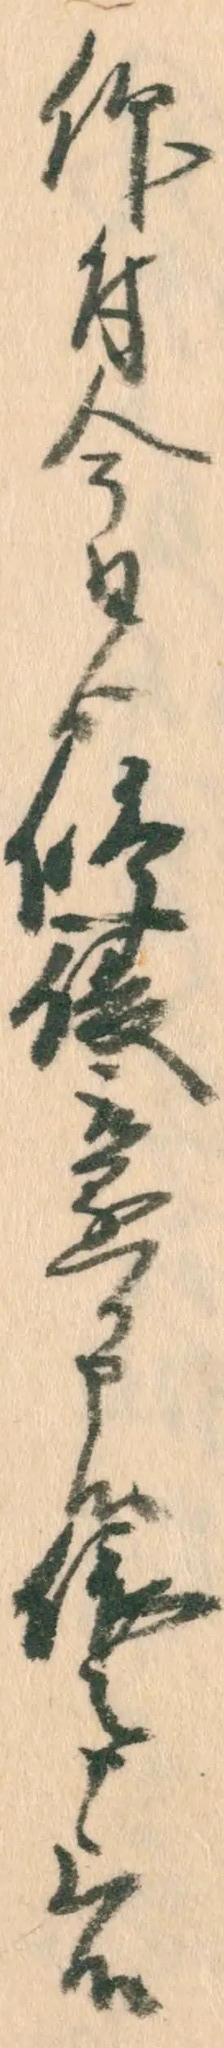仰付今日ゟ修復取懸り申候依之申上候
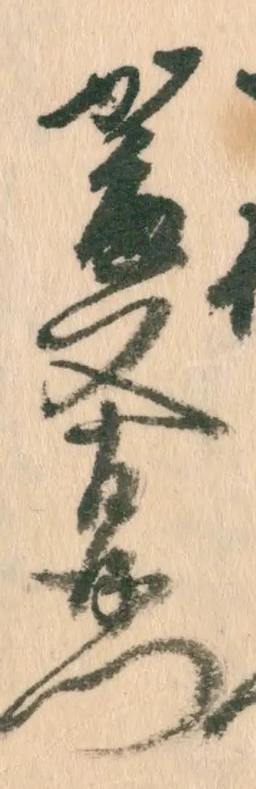加藤又左衛門
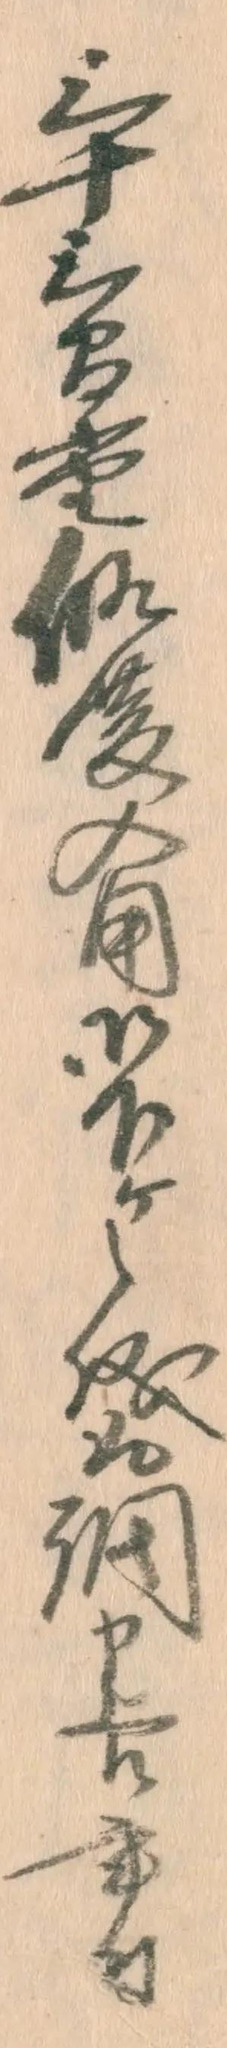│三十三間堂修復入用御下ヶ之儀取調申上候書付
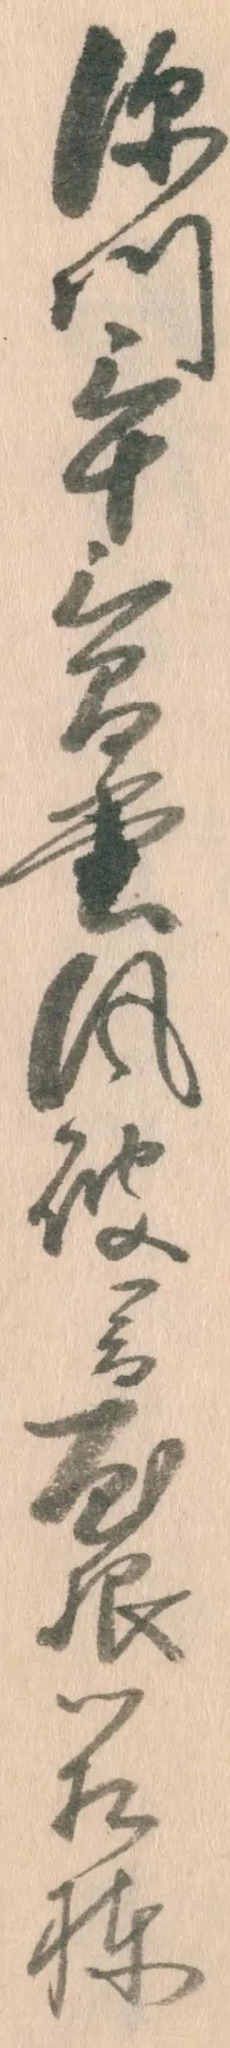深川三十三間堂風破に而屋根箱棟
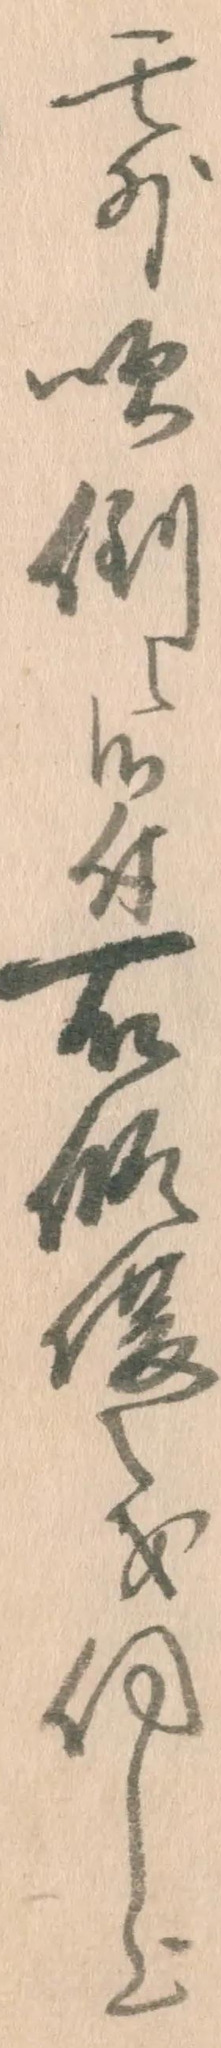其外吹倒れ候付右修復之義伺申上
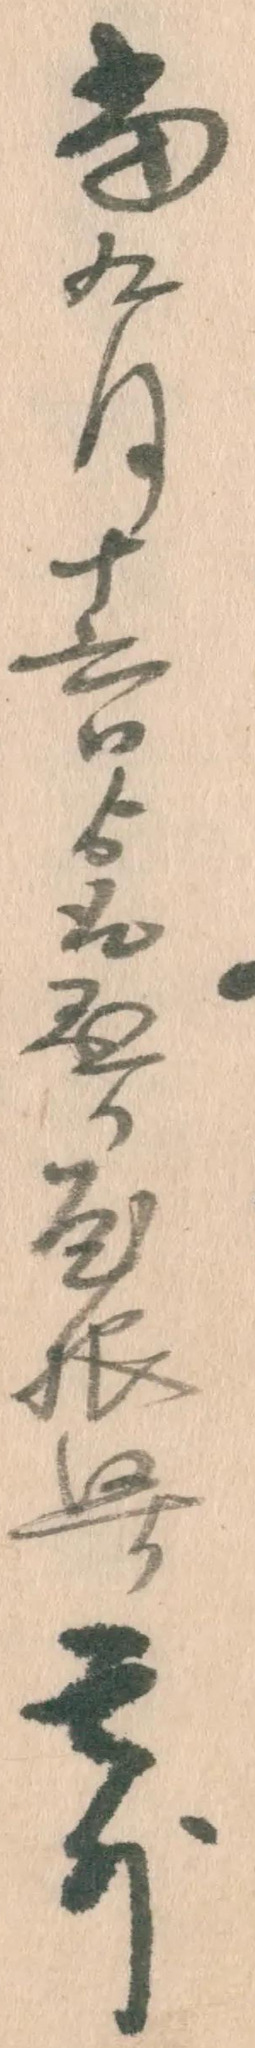当九月十六日ゟ取懸り屋根廻り其外

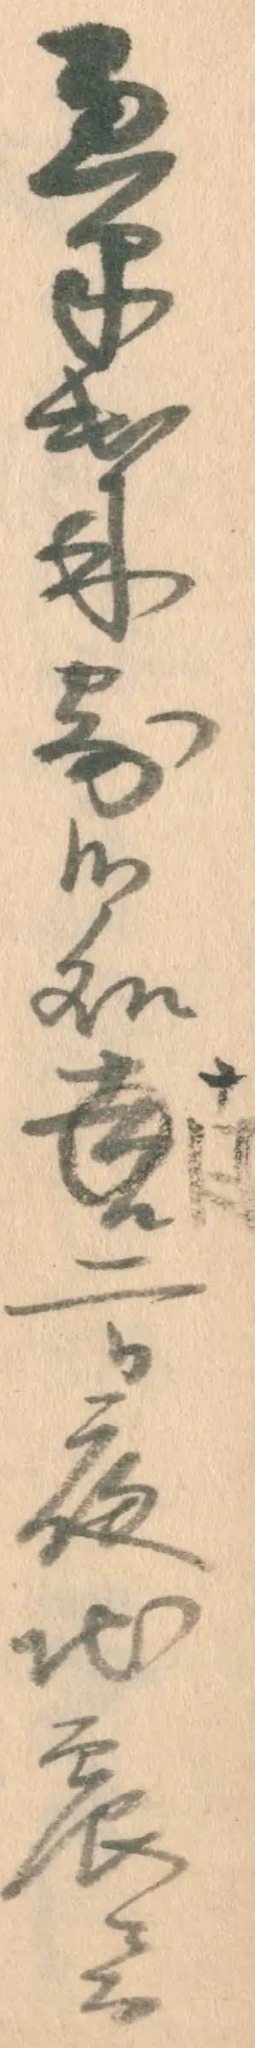過半出来寄候処十月二日夜地震に而
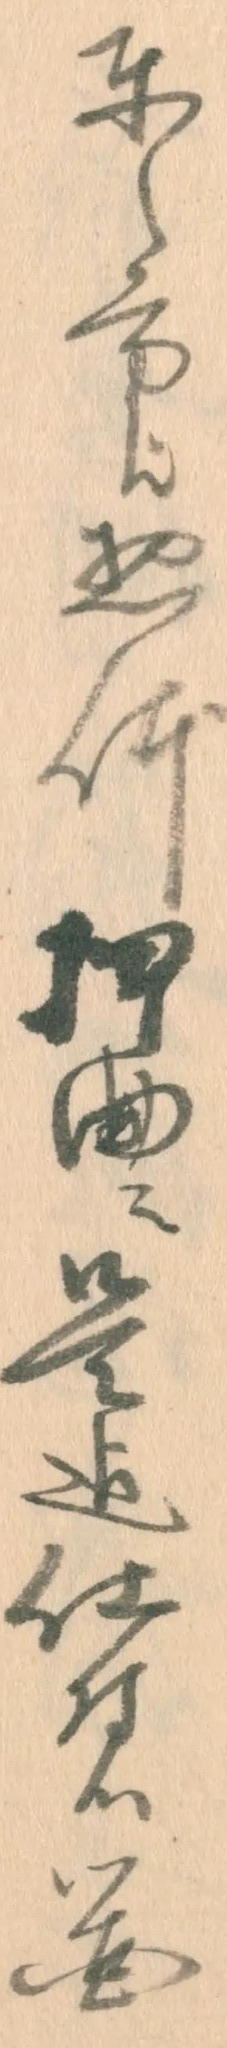東之方え惣体押曲み是迄仕付候箇
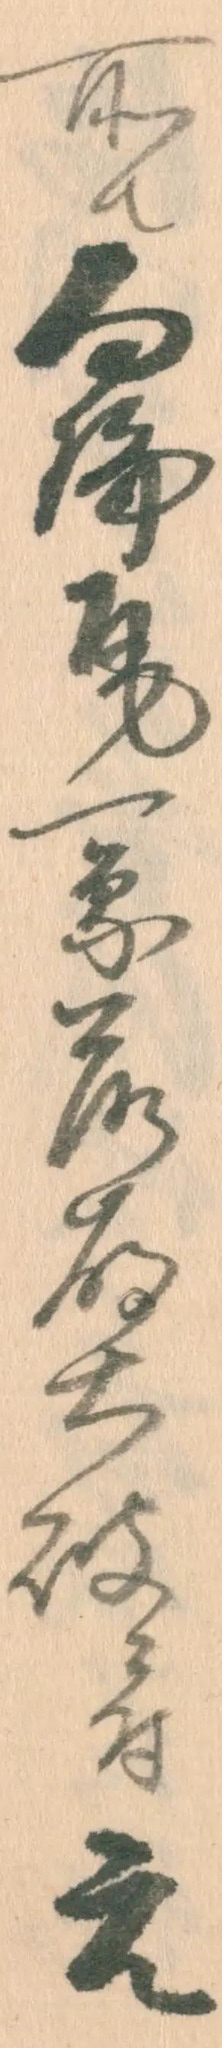所は勿論瓦一円落崩大破に付元
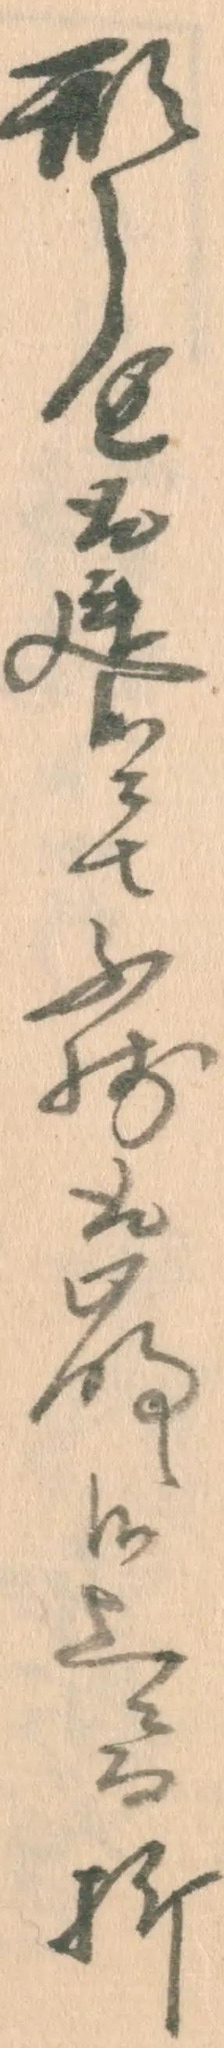形之通取建候には不残取崩し候上に而折
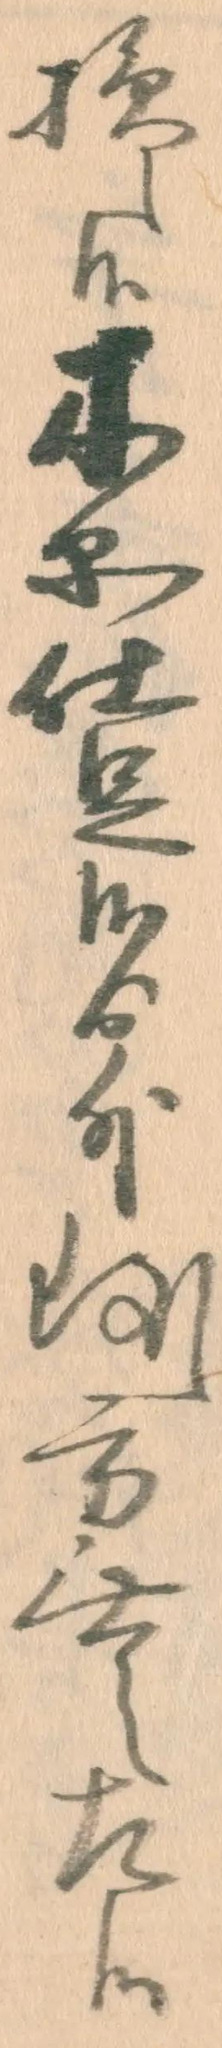損し候木品仕足候ゟ外致し方無之左候
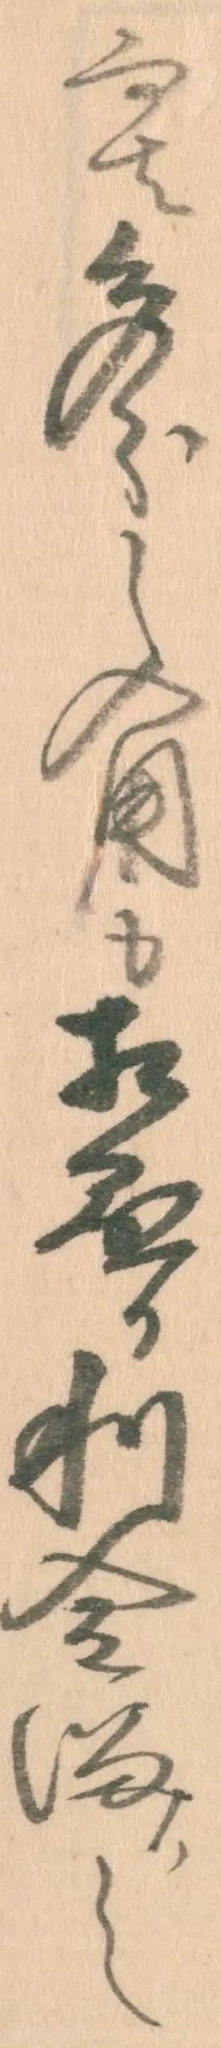而は多分之入用も相懸り利金溜り之
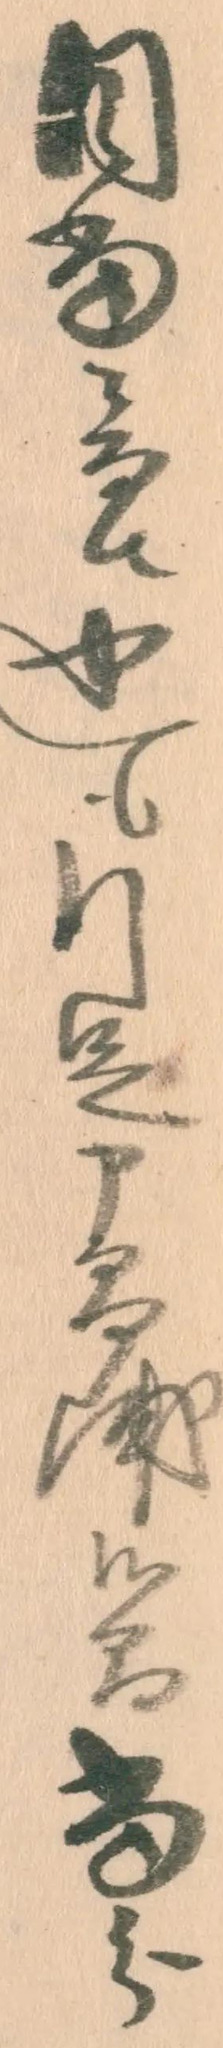目当に而は迚も行足申間鋪候間当分
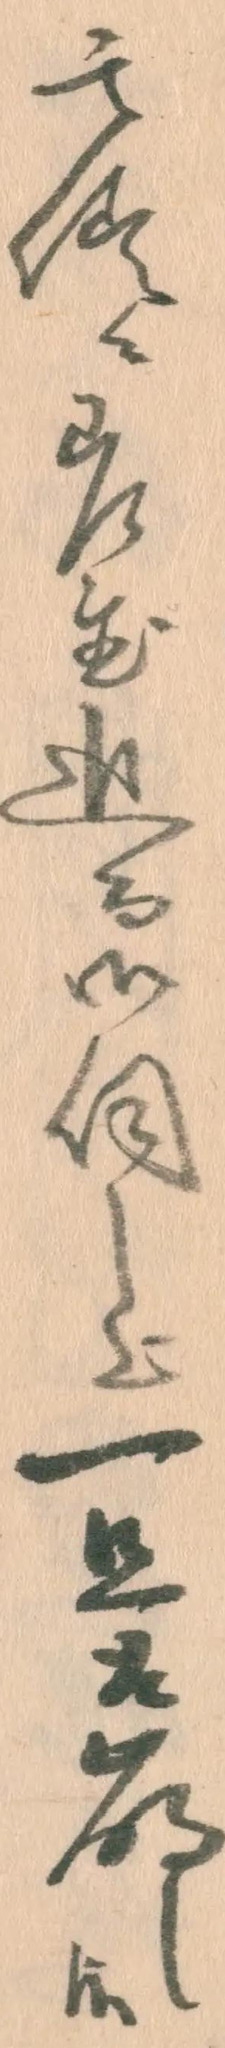其儘に差置追而御伺之上一旦取崩し候
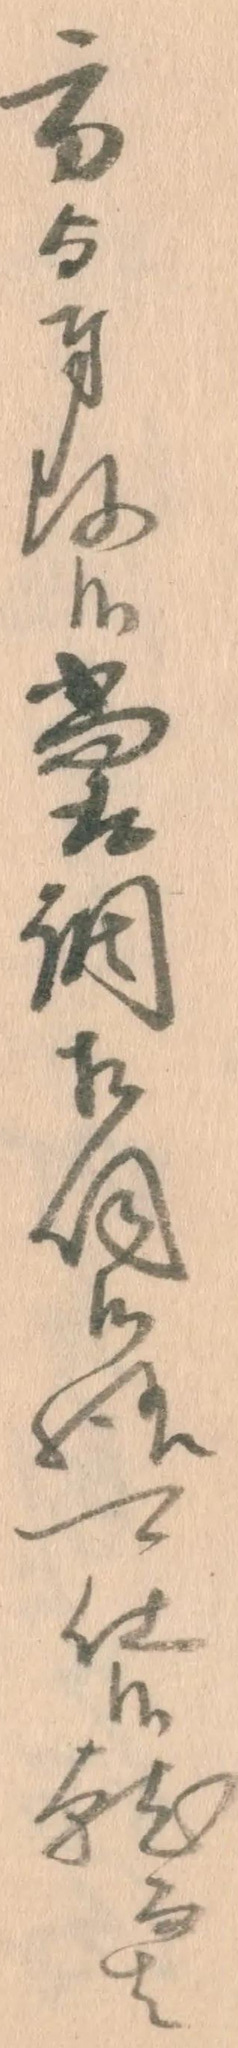方と奉存候尚取調相伺候様可仕候就而は
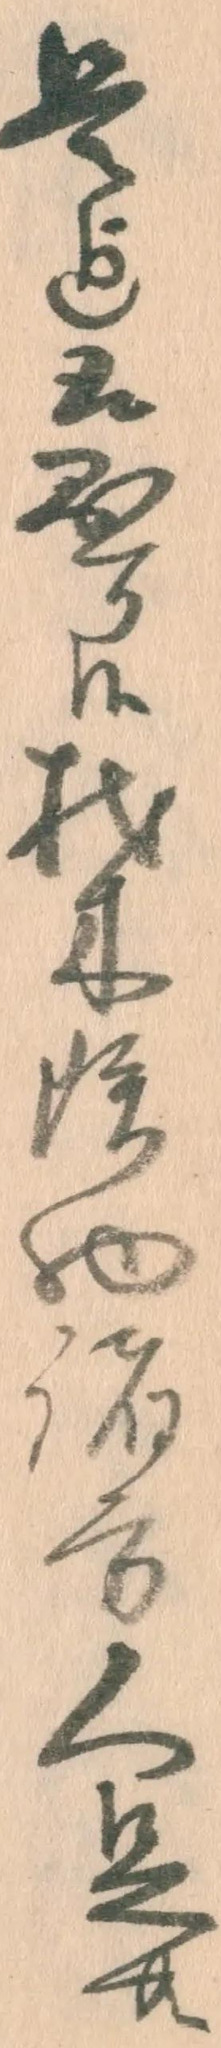是迄取懸り候材木鉄物諸方人足共
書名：三十三間堂. [1]
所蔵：国立国会図書館 National Diet Library, JAPAN
